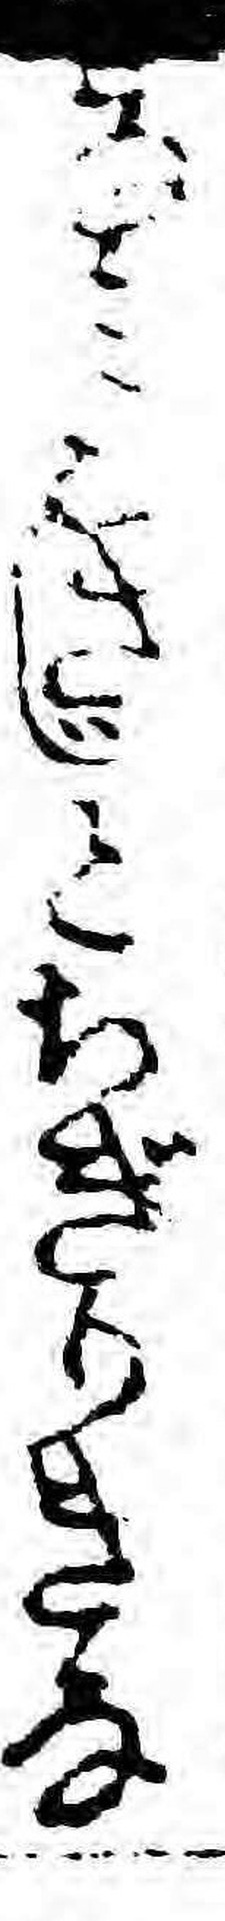なみこさじとちぎりきな
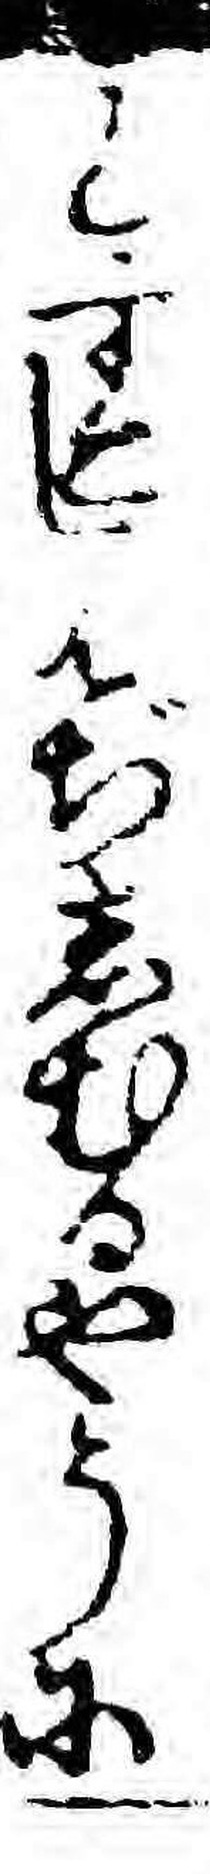とすこしはぢしむるやうに
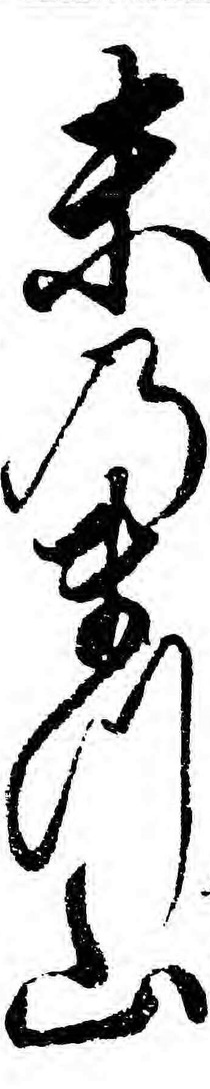末のまつ山
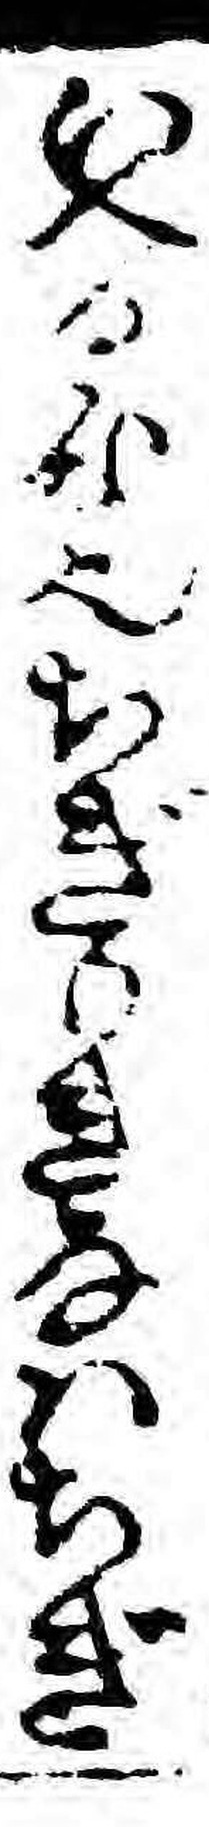いへる心也ちぎりきなはちぎ
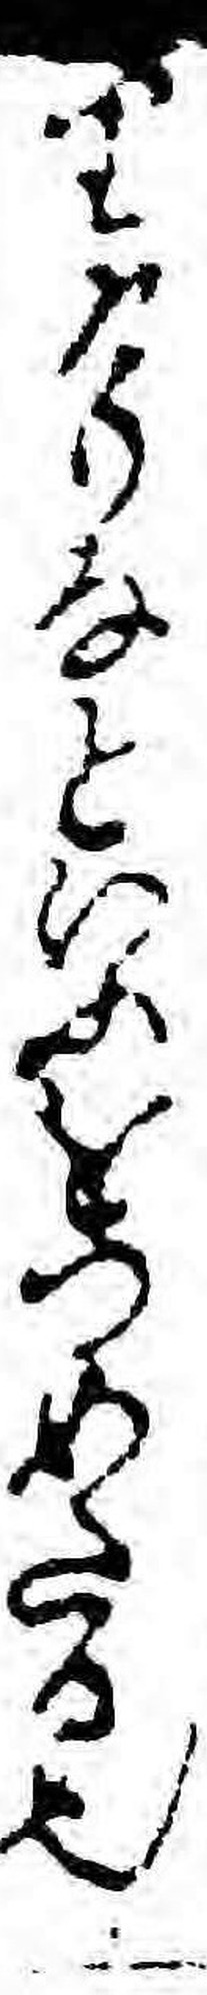りけりなといふをつめたる也
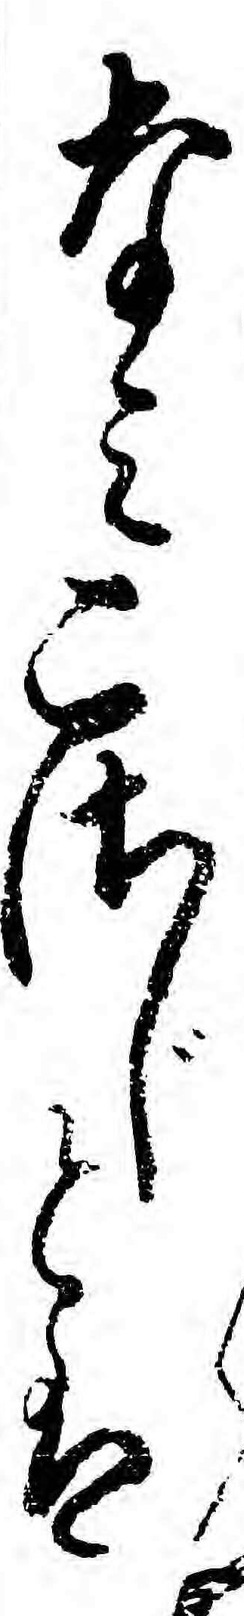なみこさじとは
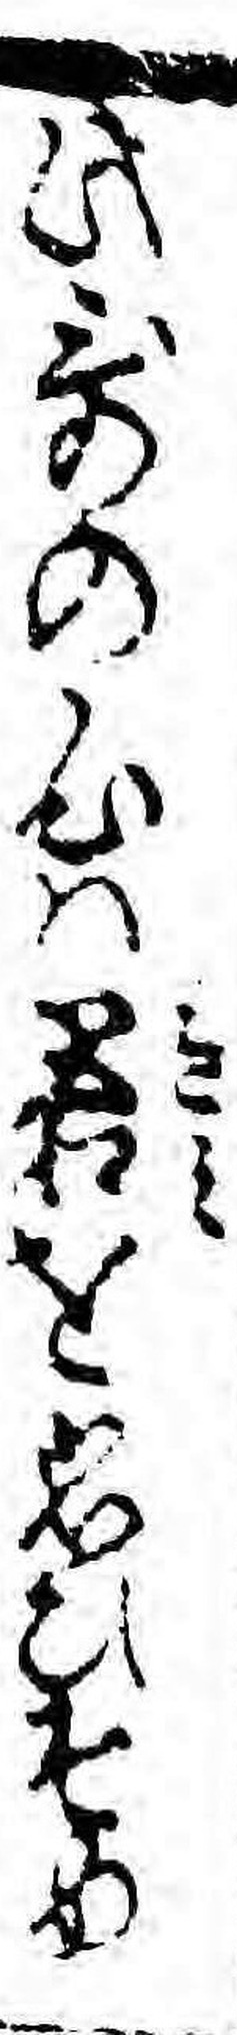此哥の心は君を思ひそめ
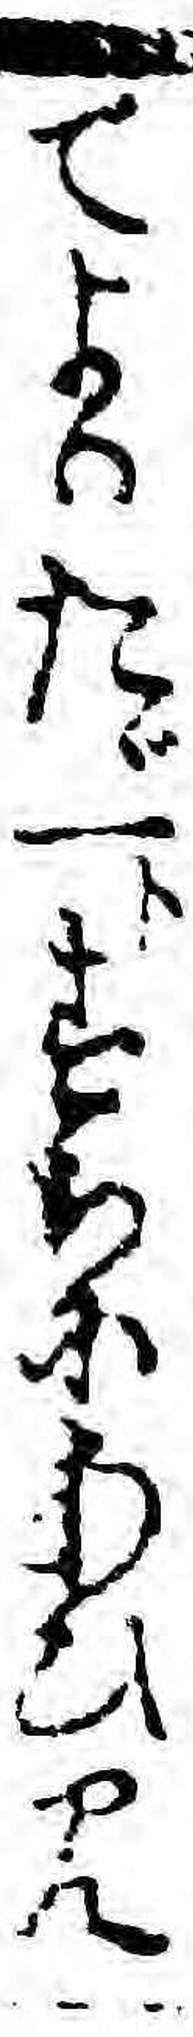てよりたゞ一トすちにあひ見
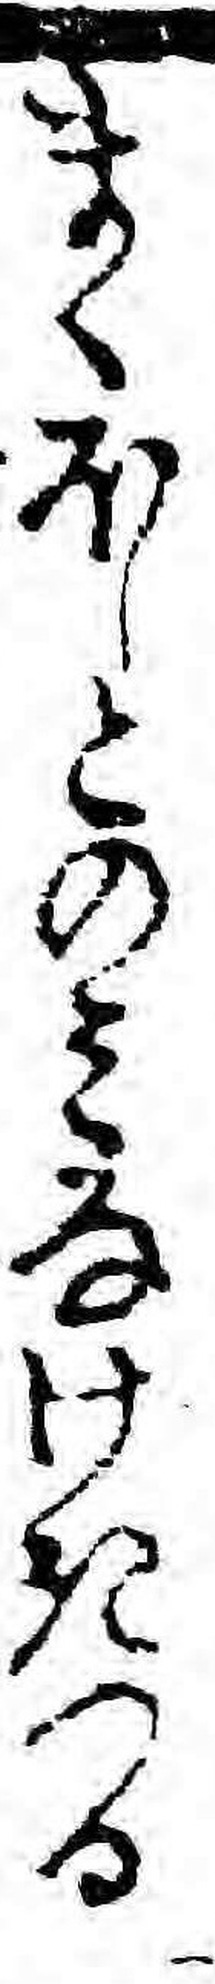まくほしとのみなけきつる
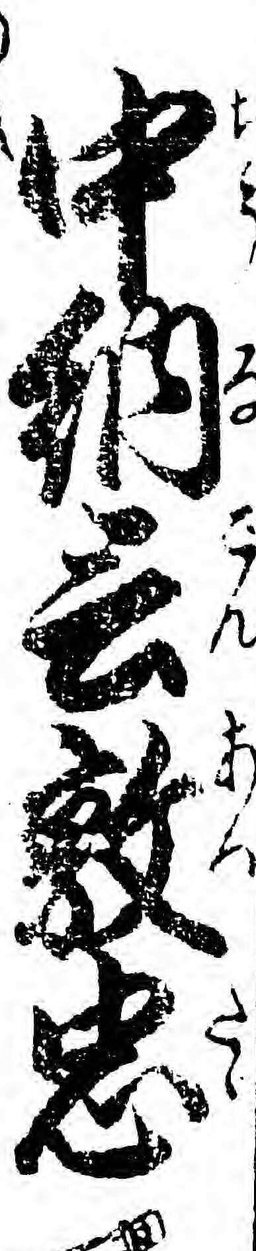中納言敦忠
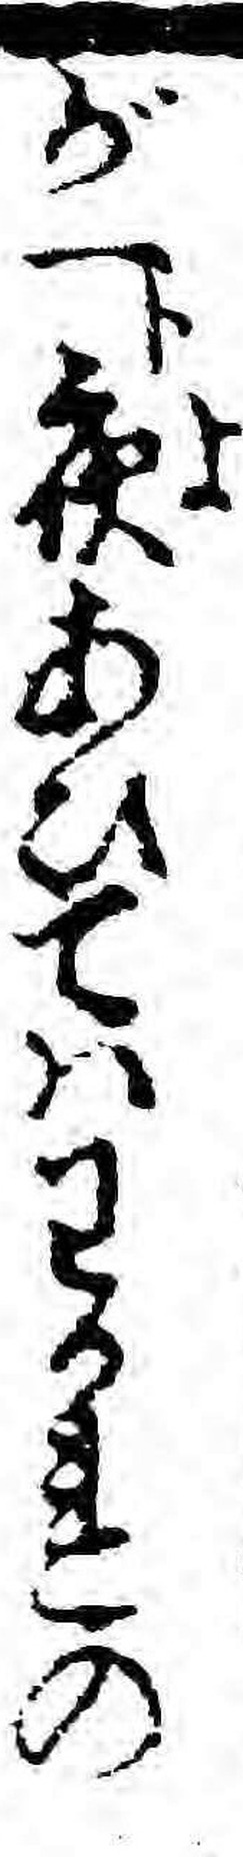が一ト夜あひてはわかれの
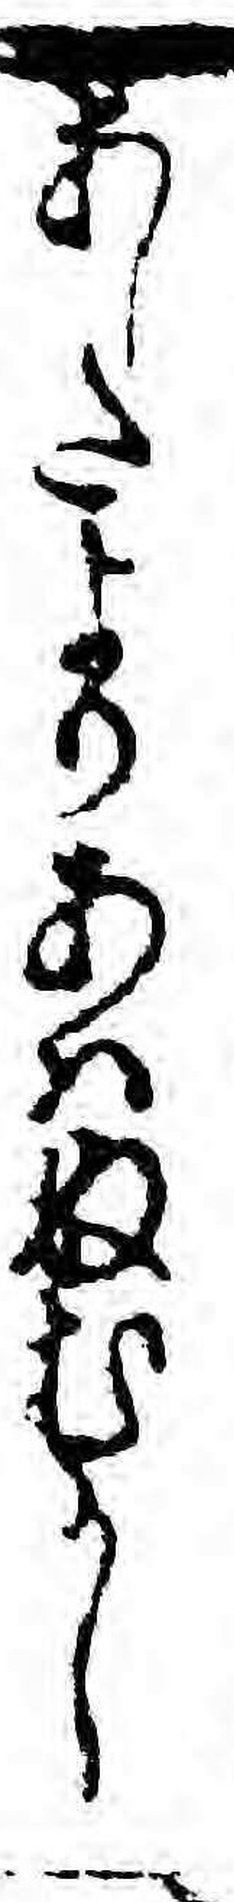あしたよりあはぬむかし
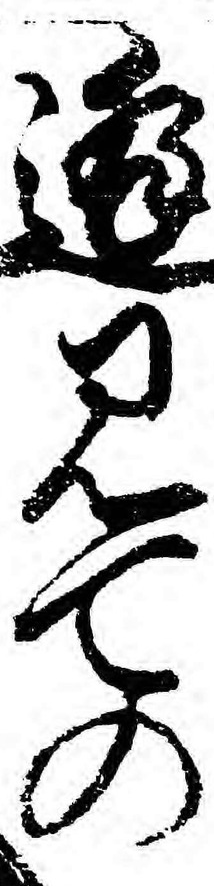逢見ての
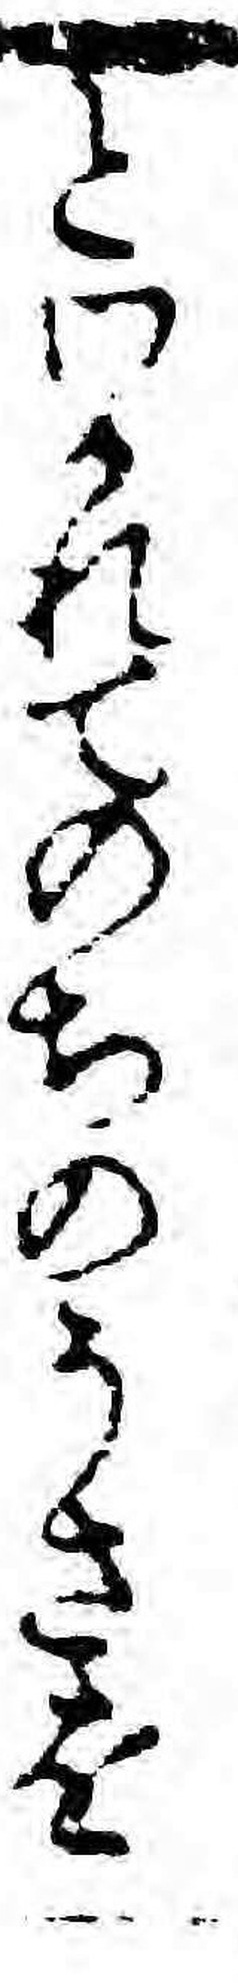とわかれてのちのうさを
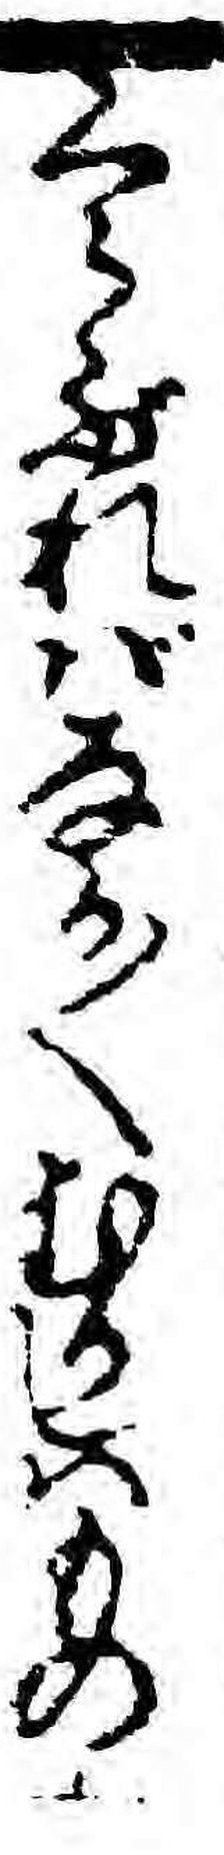くらぶればなか〳〵むかしはもの
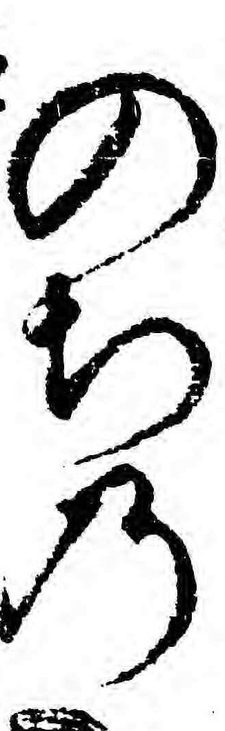のちの
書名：頭書和歌注譯／壽賀多百人一首小倉錦
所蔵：国文学研究資料館
